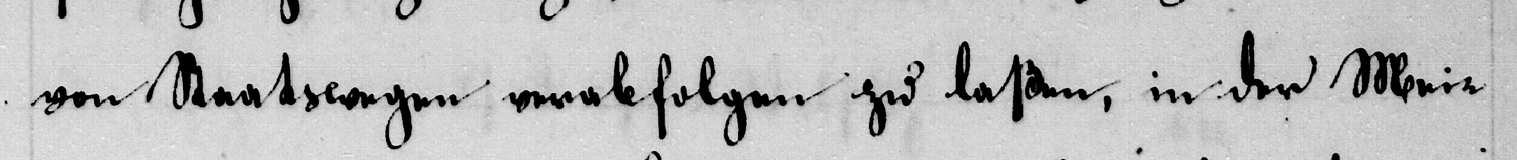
von Staatswegen verabfolgen zu laßen, in der Mei¬
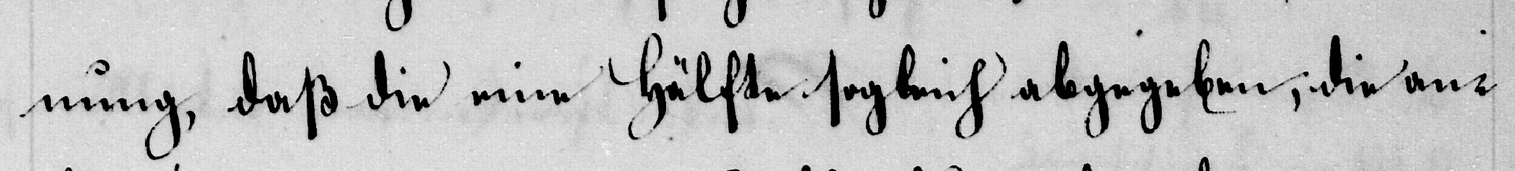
nung, daß die eine Hälfte sogleich abgegeben, die an¬
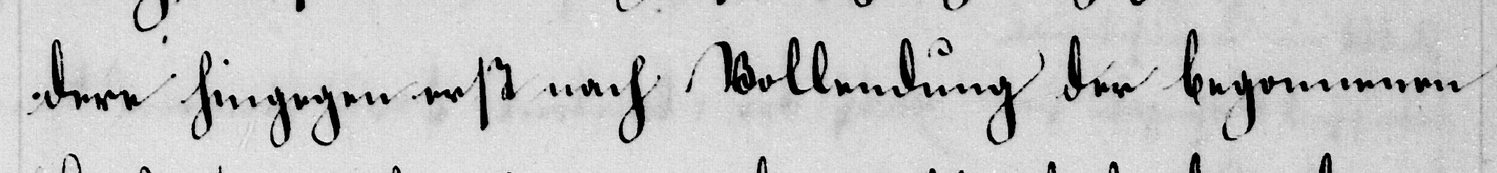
dere hingegen erst nach Vollendung der begonnenen
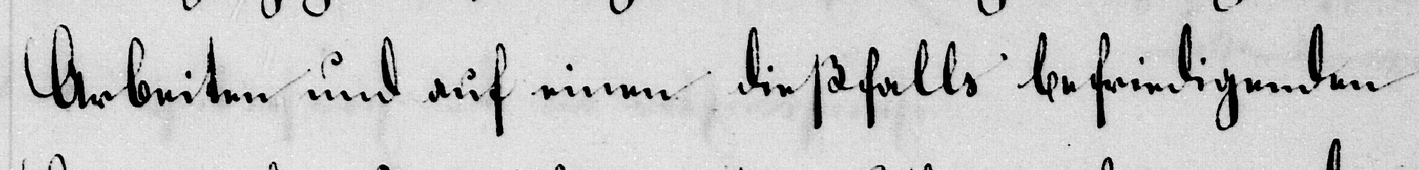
Arbeiten und auf einen dießfalls befriedigenden
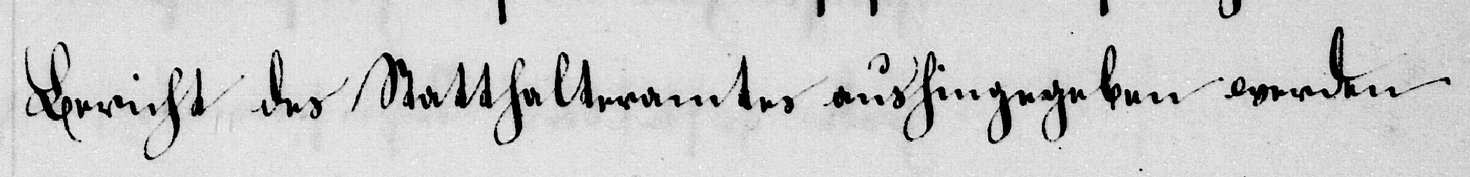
Bericht des Statthalteramtes aushingegeben werden
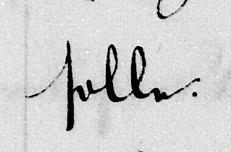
solle.
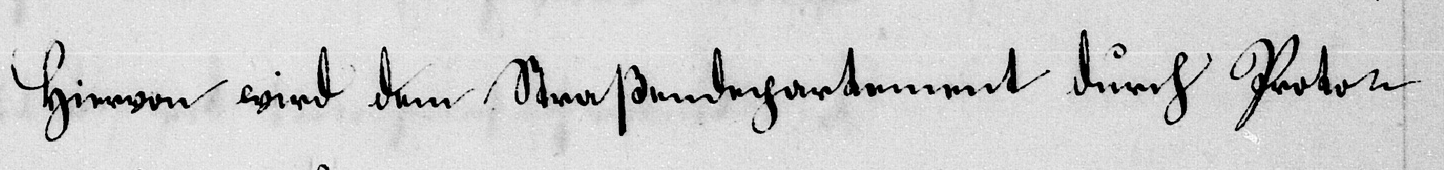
Hiervon wird dem Straßendepartement durch Proto¬
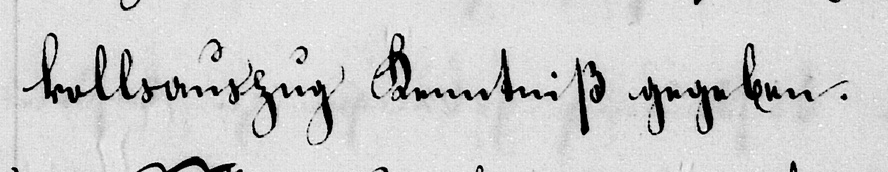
kollsauszug Kenntniß gegeben.
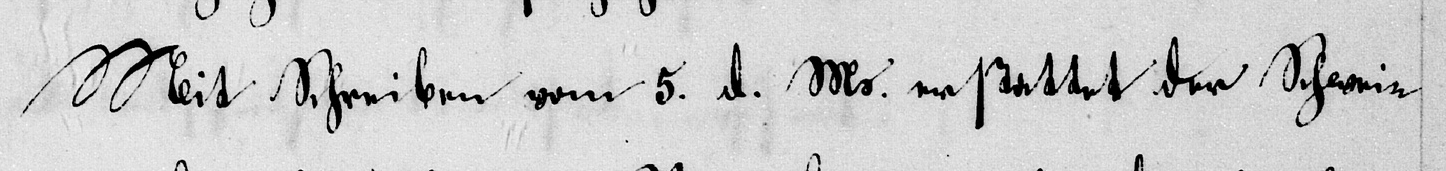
Mit Schreiben vom 5. d. Ms. erstattet der Schwei¬
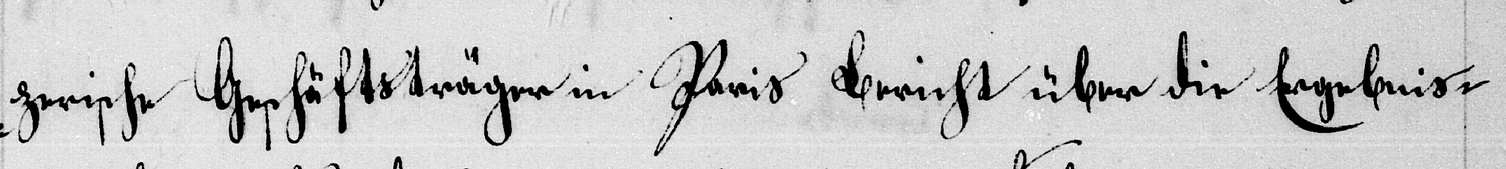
zerische Geschäftsträger in Paris Bericht über die Ergebni¬
